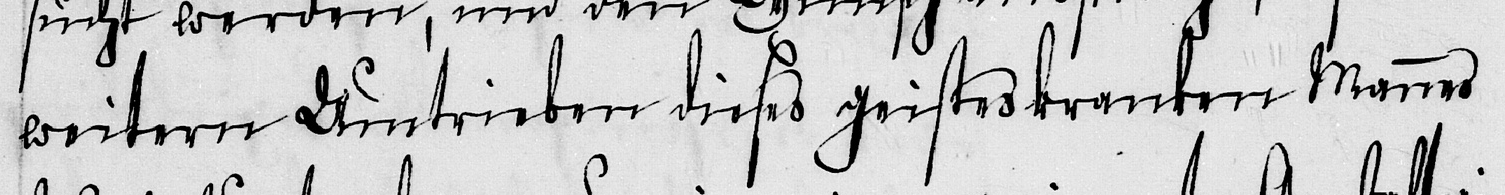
weitern Umtrieben dieses geisteskranken Mannes
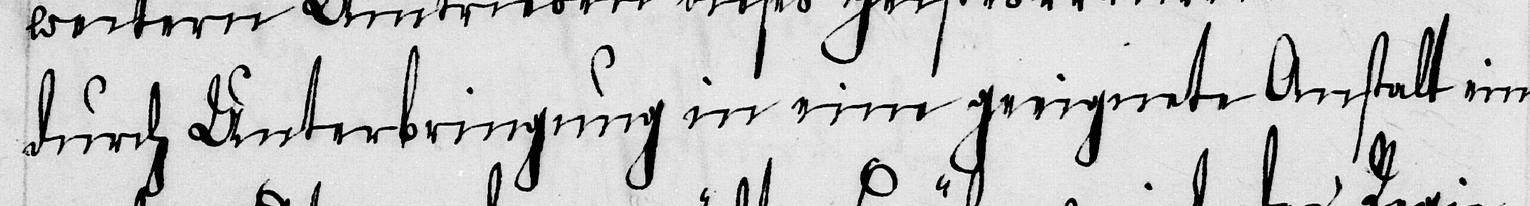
durch Unterbringung in eine geeignete Anstalt ein
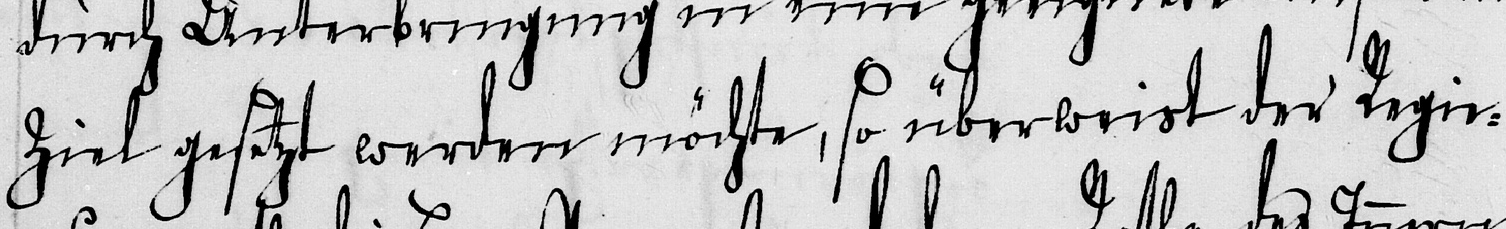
Ziel gesetzt werden möchte, so überweist der Regie¬
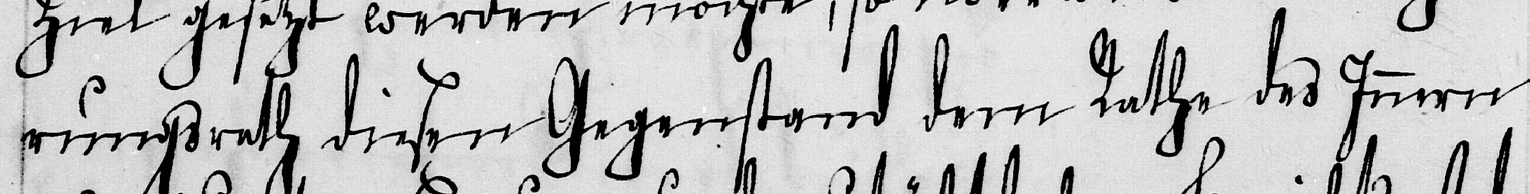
rungsrath diesen Gegenstand dem Rathe des Innern
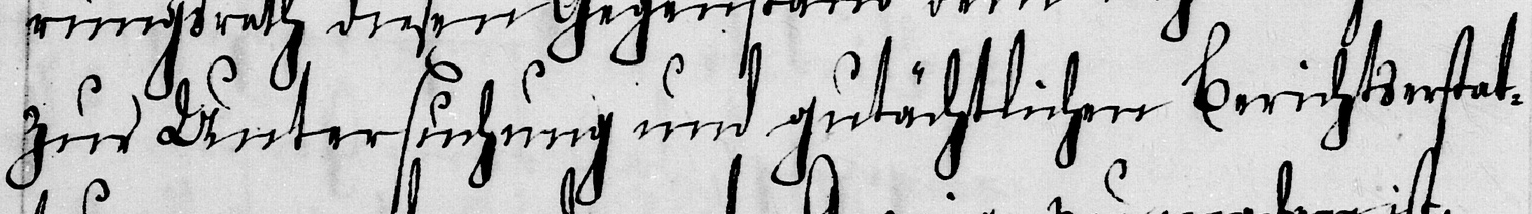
zur Untersuchung und gutächtlichen Berichtsersta¬
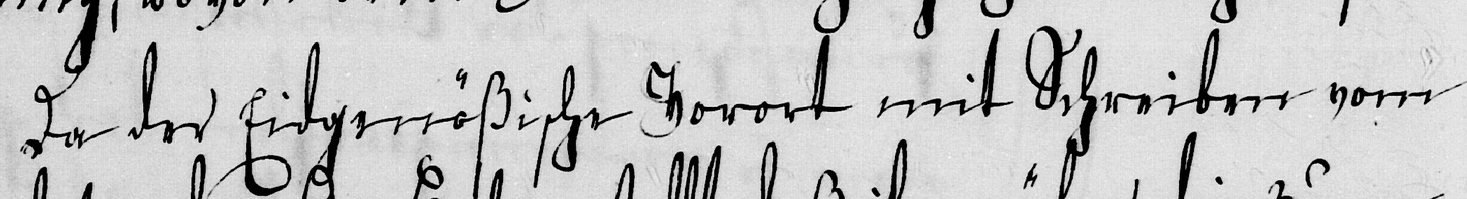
Da der Eigenößische Vorort mit Schreiben vom
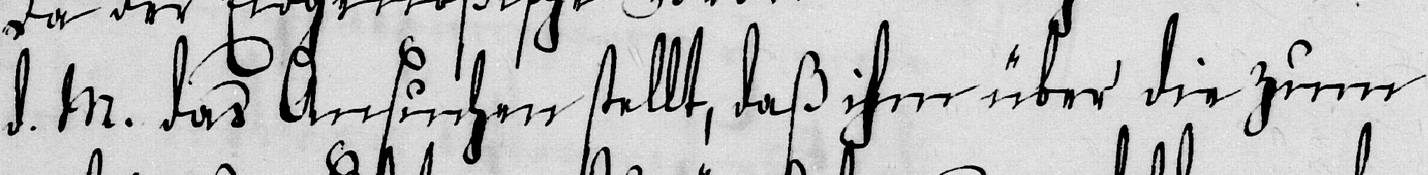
d. M. das Ansuchen stellt, daß ihm über die zum
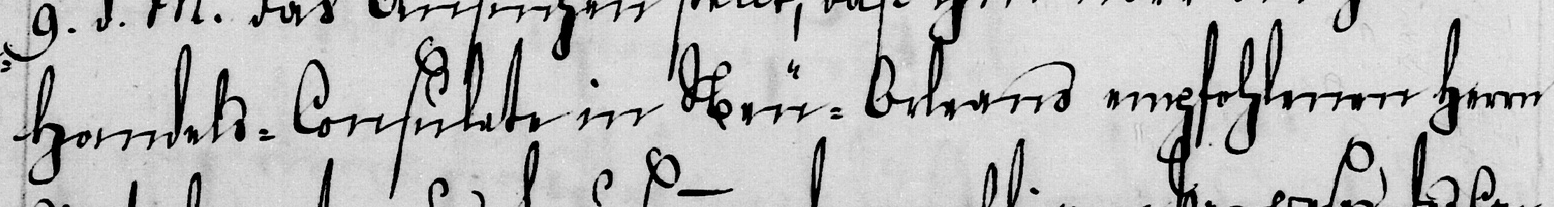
Handels-Consulate in Neu-Orleans empfohlenen Herrn
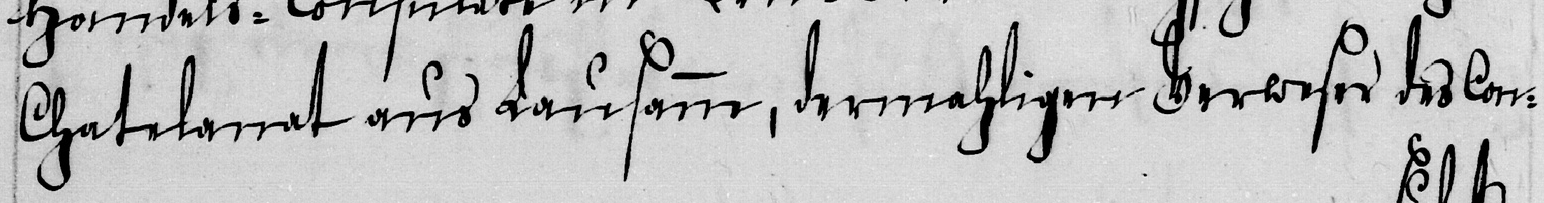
Chatelanat aus Lausanne, dermahligen Verweser des Con¬
